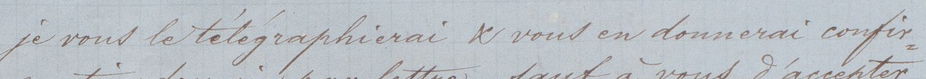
je vous le télégraphierai & vous en donnerai confir-
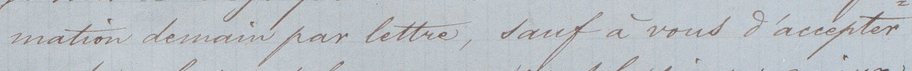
mation demain par lettre, sauf à vous d'accepter
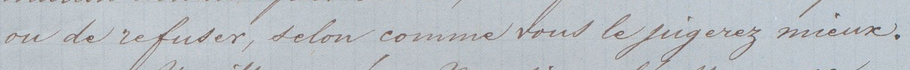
ou de refuser, selon comme vous le jugerez mieux.
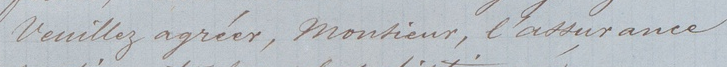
Veuillez agréer, Monsieur, l'assurance
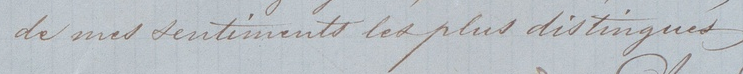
de mes sentiments les plus distingués
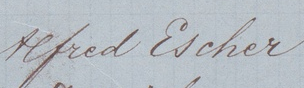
Alfred Escher
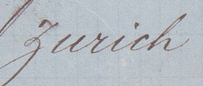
Zurich.
